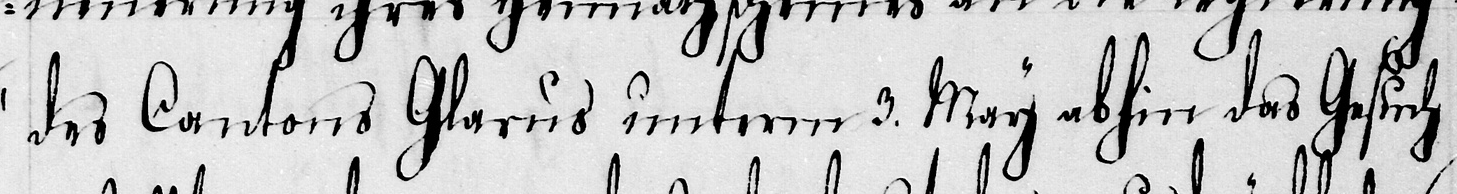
des Cantons Glarus unterm 3. May abhin das Gesuch
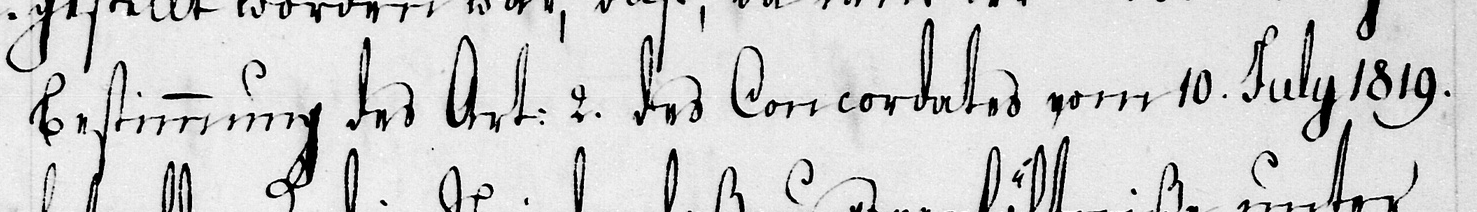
Bestimmung des Art: 2. des Concordates vom 10. July 1819.
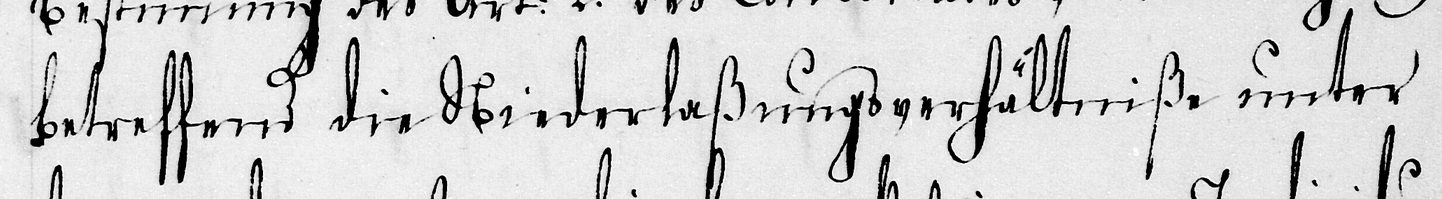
betreffend die Niederlaßungsverhältniße unter
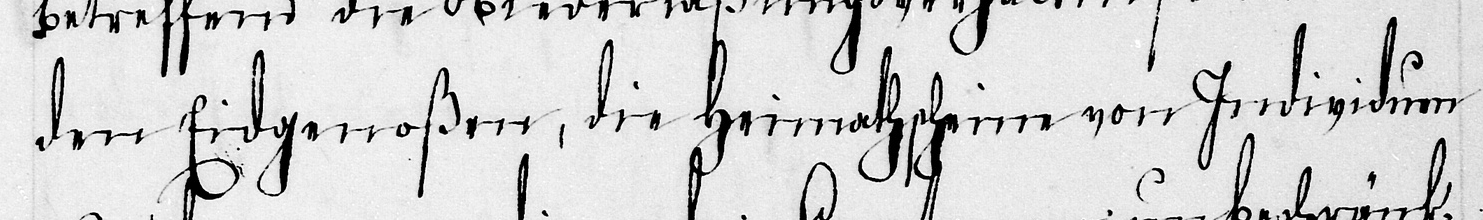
den Eidgenoßen, die Heimathscheine von Individuen
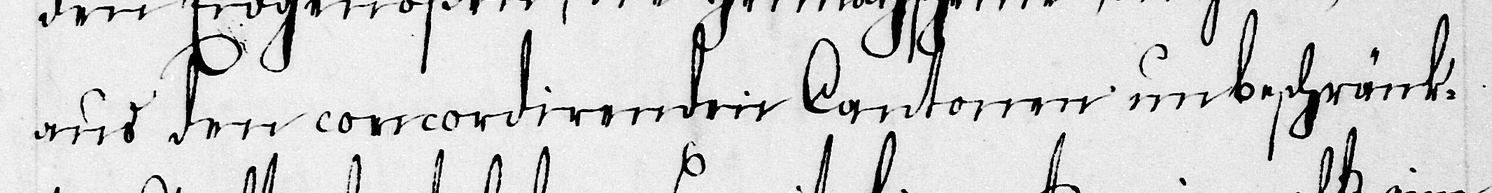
aus den concordirenden Cantonen unbeschränk¬
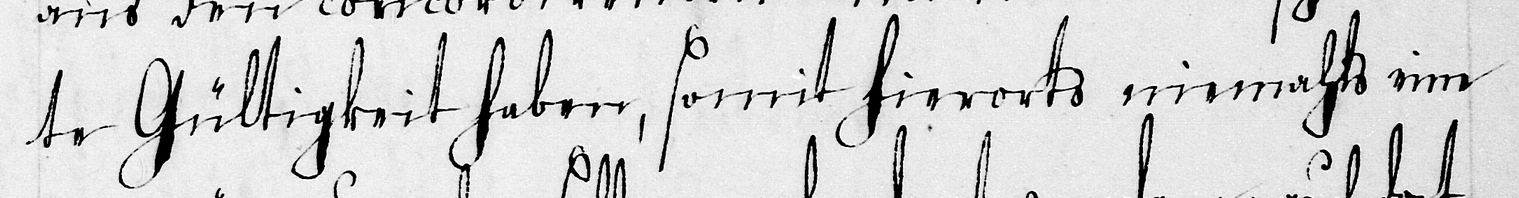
te Gültigkeit haben, somit hierorts niemahls eine
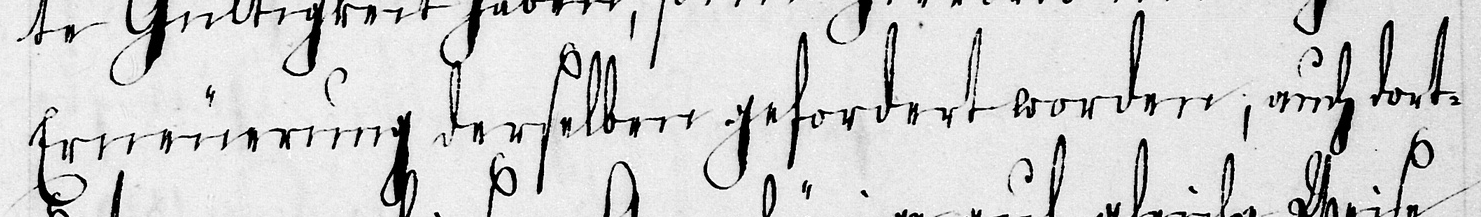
Erneuerung derselben gefordert worden, auch dort¬
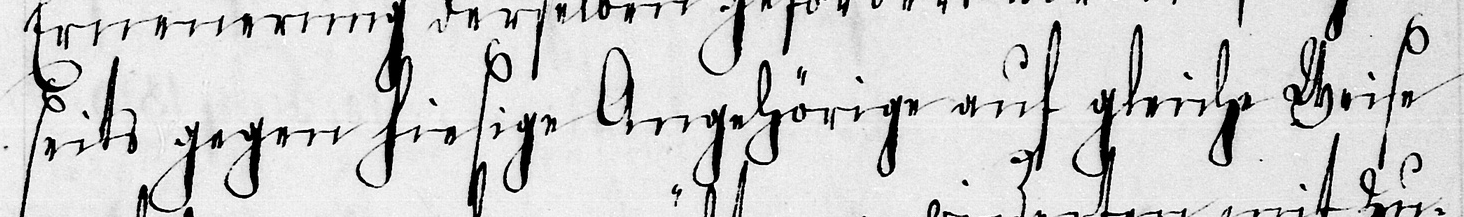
seits gegen hiesige Angehörige auf gleiche Weise
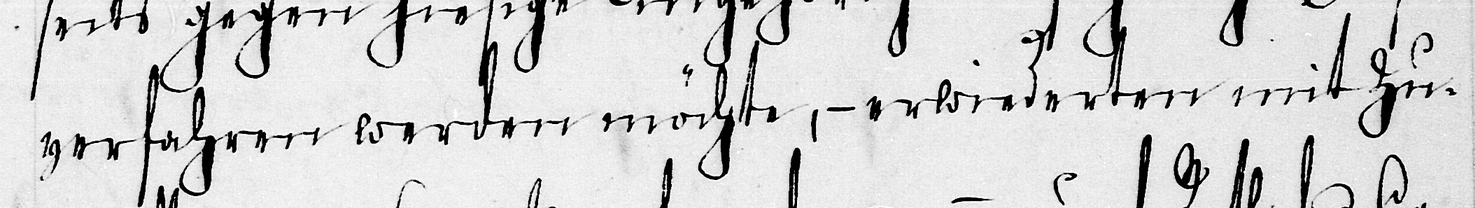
verfahren werden möchte, – erwiederten mit Zu¬
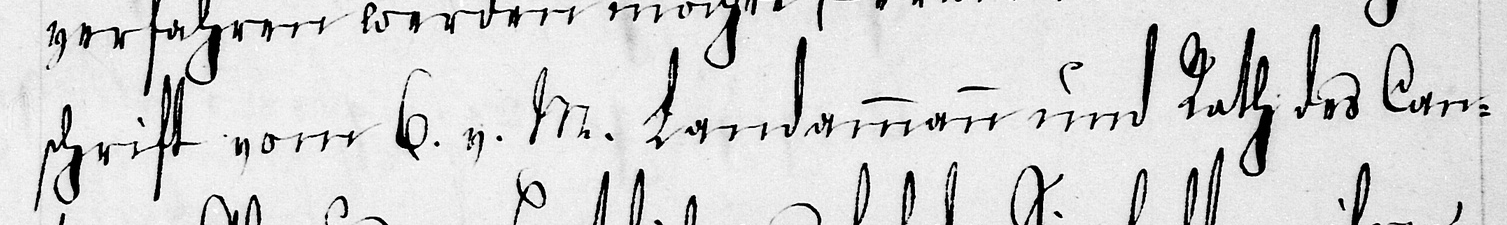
schrift vom 6. v. M. Landammann und Rath des Can¬
